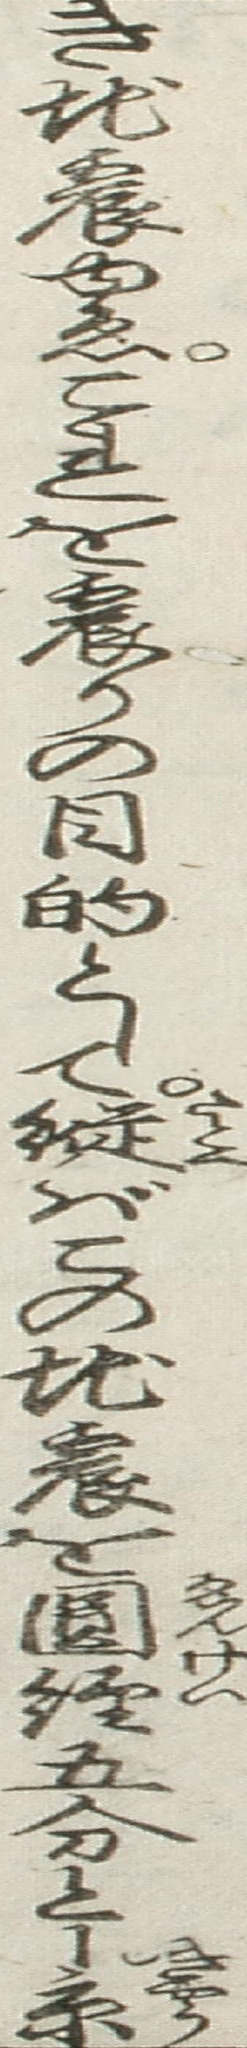き地震ゆゑ。これを震りの目的として。縦ばこの地震を円経五分とし京
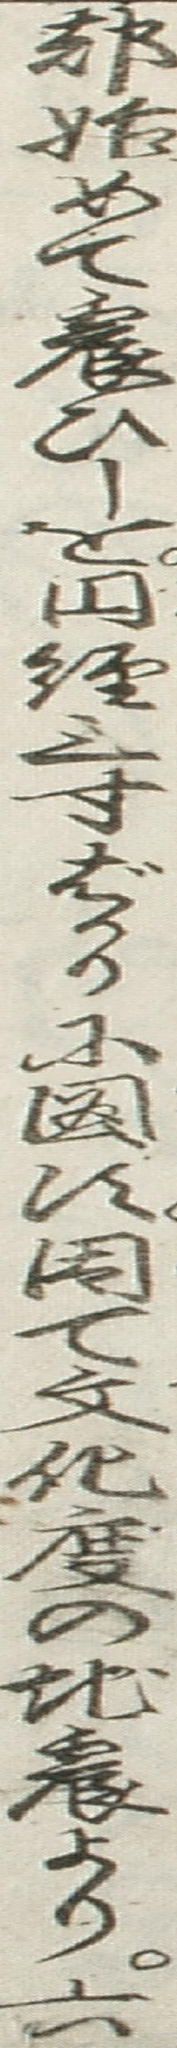都始めて震ひしを。円経三寸ばかりに図す。因て文化度の地震より。六
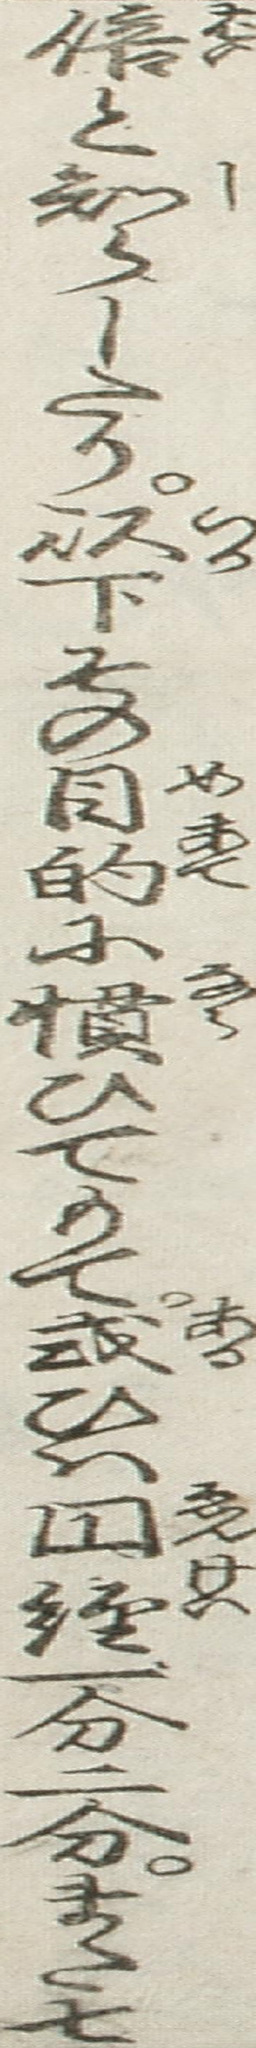倍と知らしたり。以下その目的に慣ひてもて。或ひは円経一分二分。また七
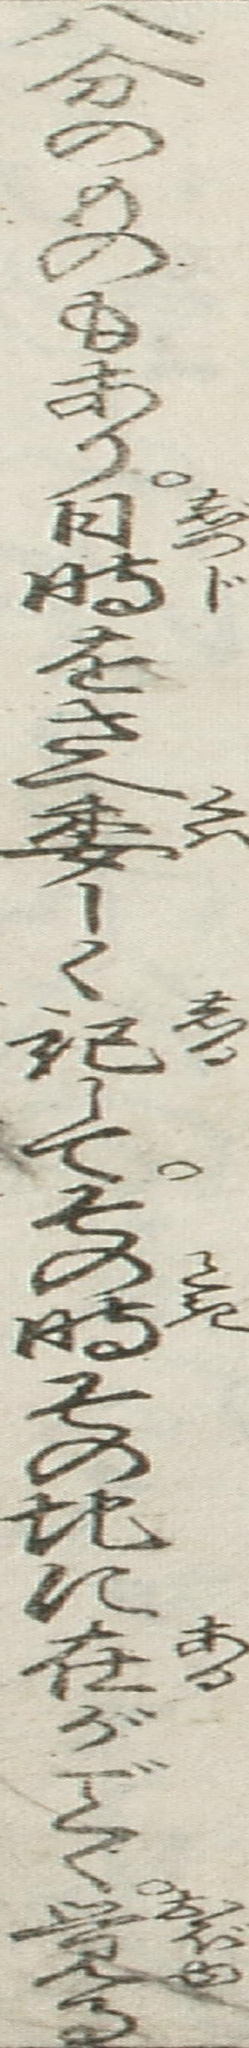八分のものもあり。日時をさへ委しく記して。その時その地に在がごとく。覚る
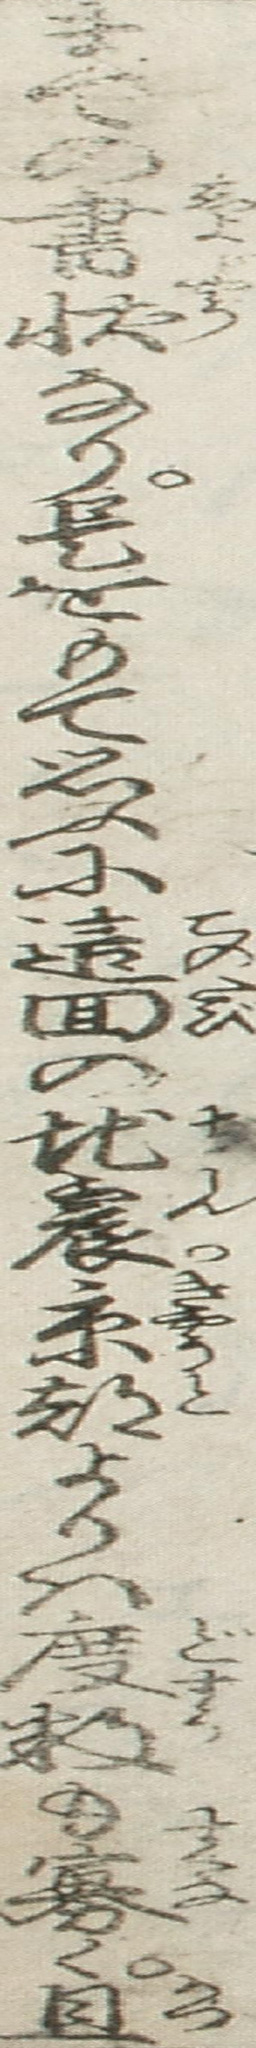までの書状なり。是をもて思ふに這回の地震。京都よりは度数も寡く。且

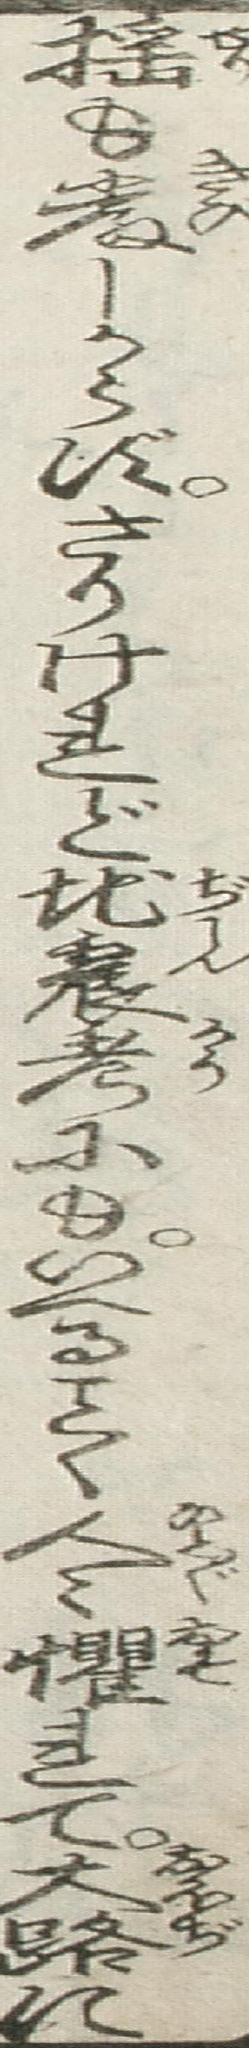揺も厳しからず。さりけれど地震考にも。いへることく人〻懼れて。大路に
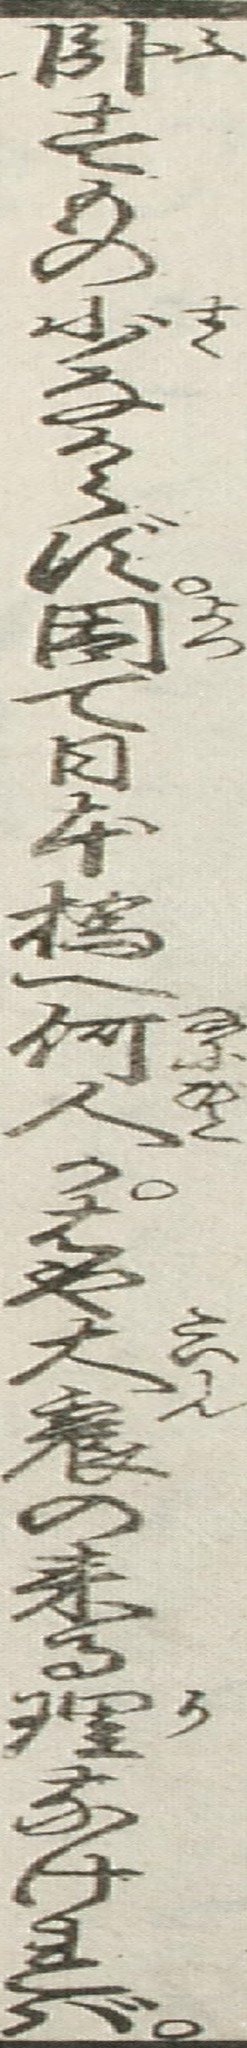臥すもの少なからず。因て日本橋へ何人か。はや大震の来る理なければ。
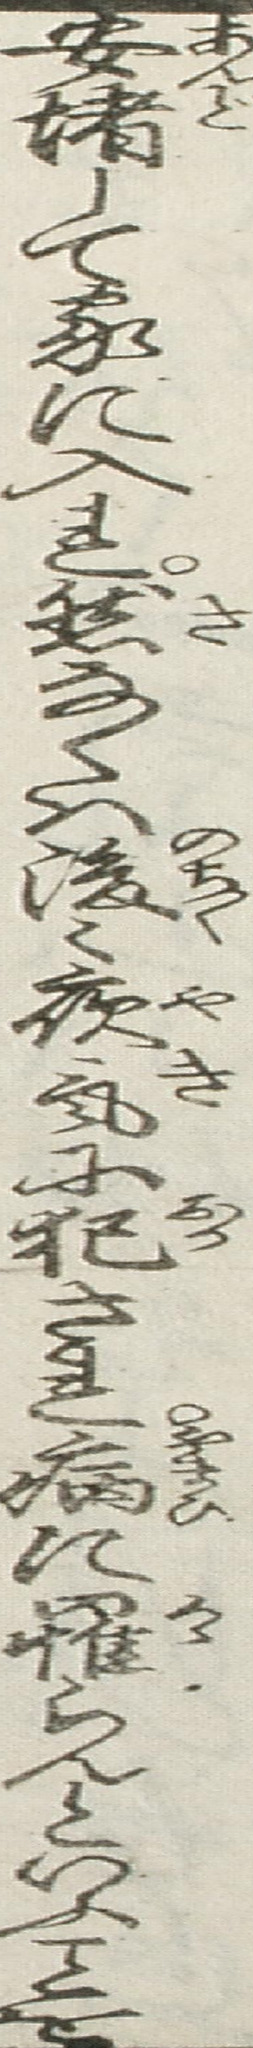安堵して家に入れ。然なくは後〻夜気に犯され。病に罹らんといふことを
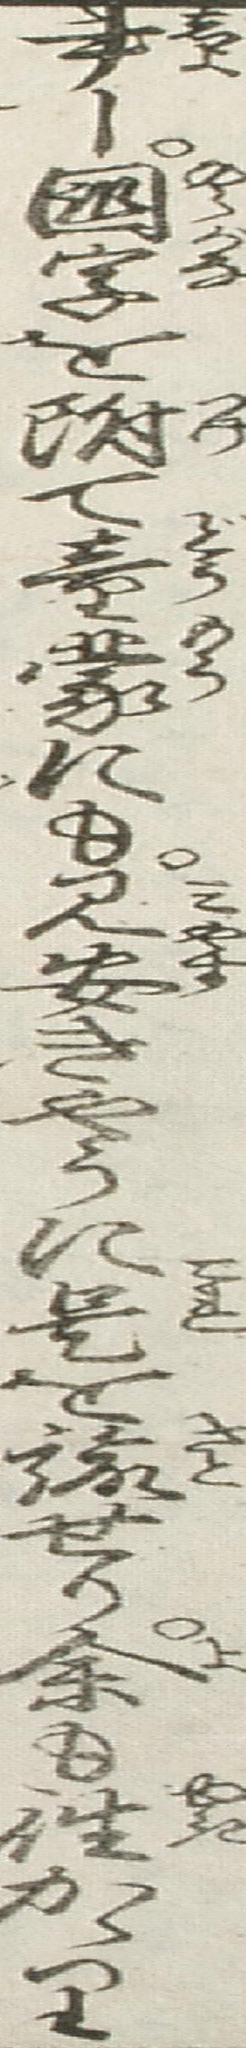書し。国字を附て童蒙にも。見安きやうに是を諭せり。余も往かゝり
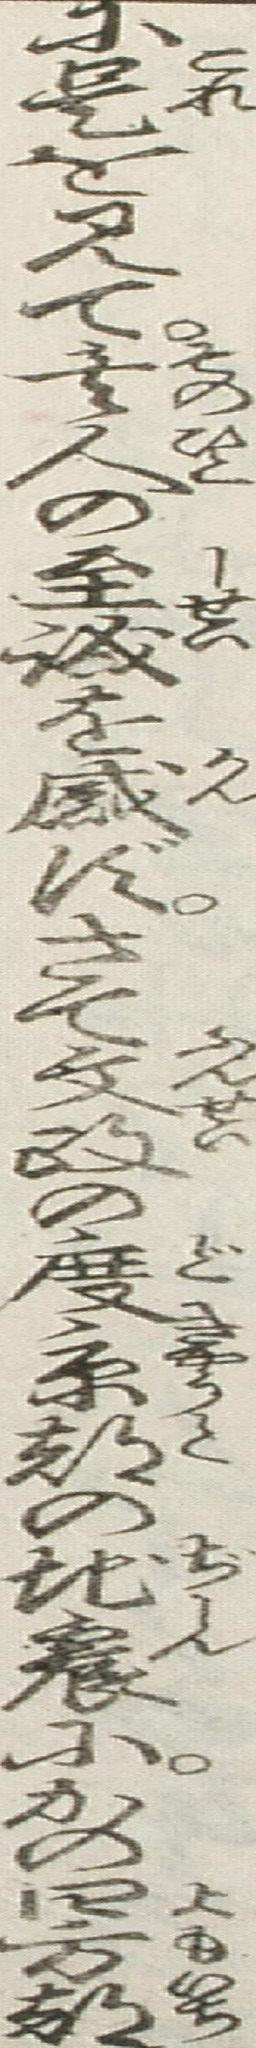に是を見て。其人の至誠を感ず。さて文政の度京都の地震に。かの四方都
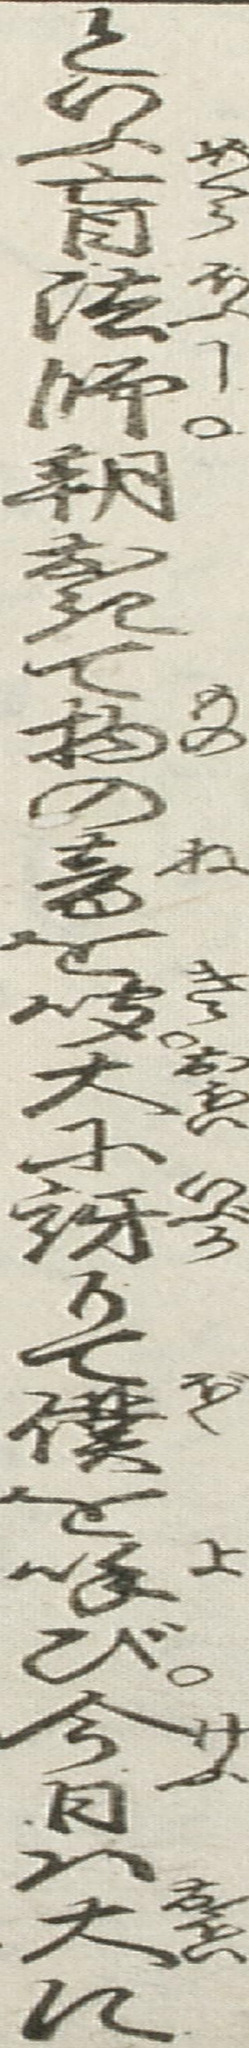といふ盲法師。朝おきて物の音を聞。大に訝りて僕を呼び。今日は大に
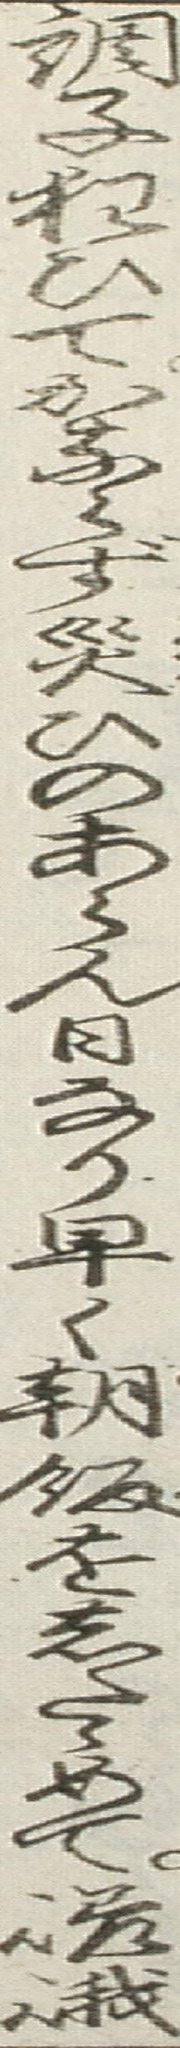調子狂ひて。かならず災ひのあらん日なり早く朝飯をしたゝめて。嵯峨
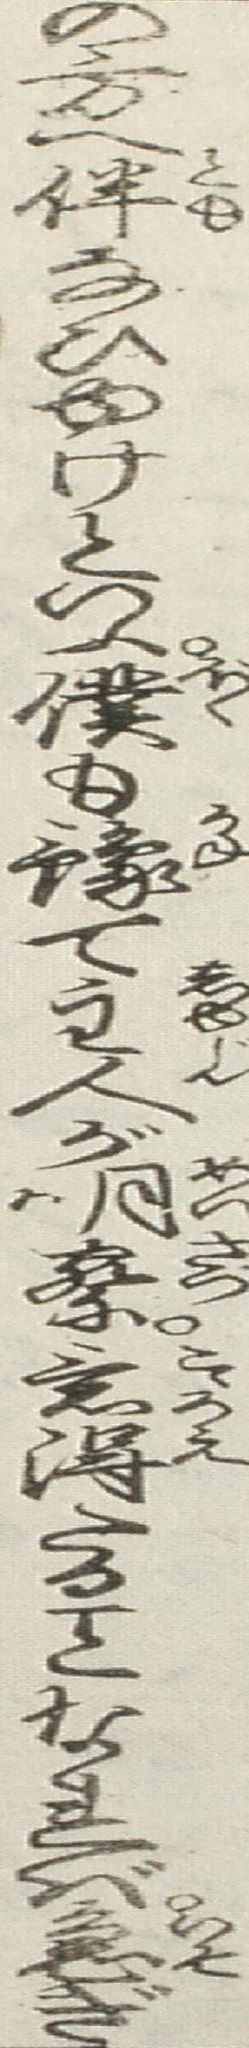の方へ伴なひゆけといふ。僕も予て主人が明察。意得たることなれば。急ぎ
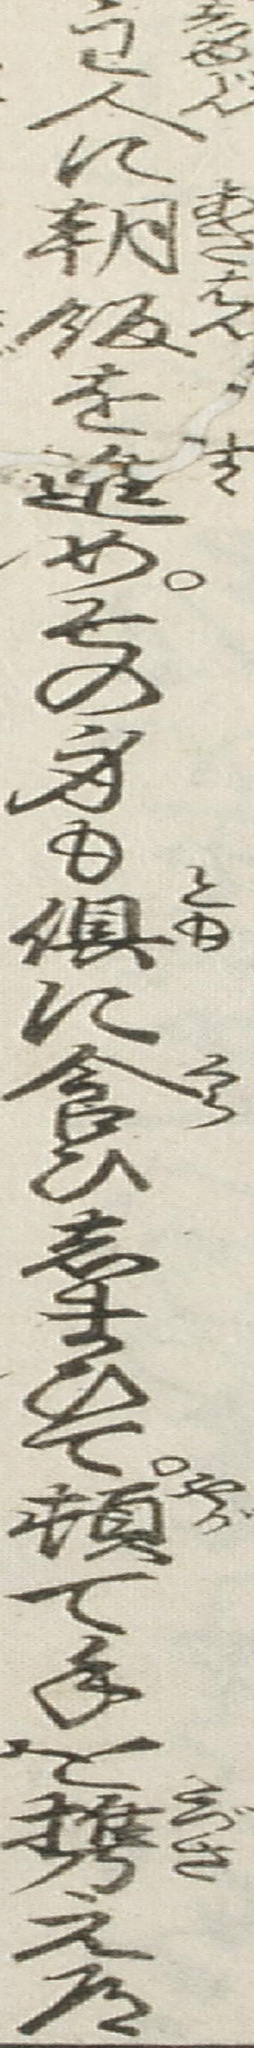主人に朝飯を進め。その身も倶に食ひしまひて。頓て手を携え道
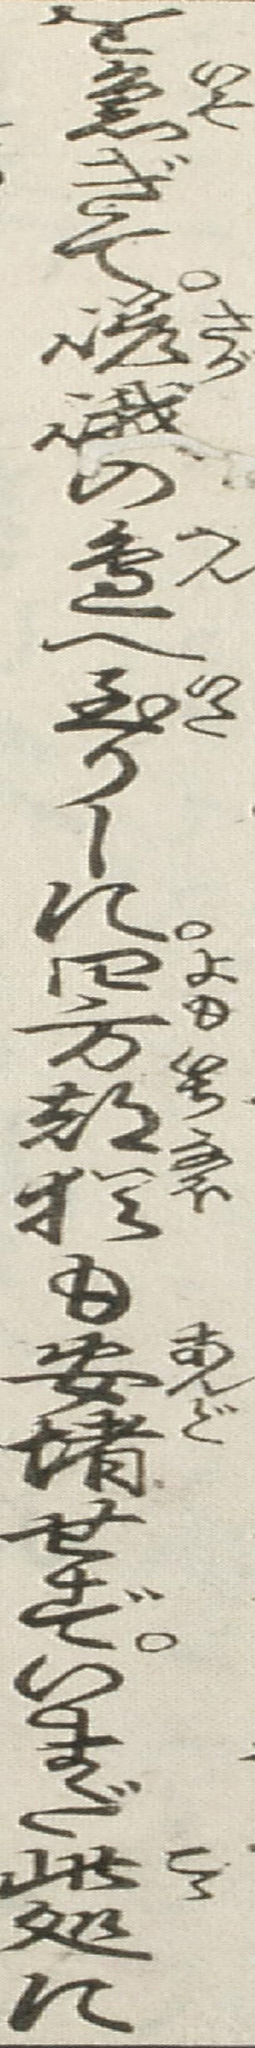を急ぎて。嵯峨の辺へ至りしに。四方都猶も安堵せず。いまだ此処に
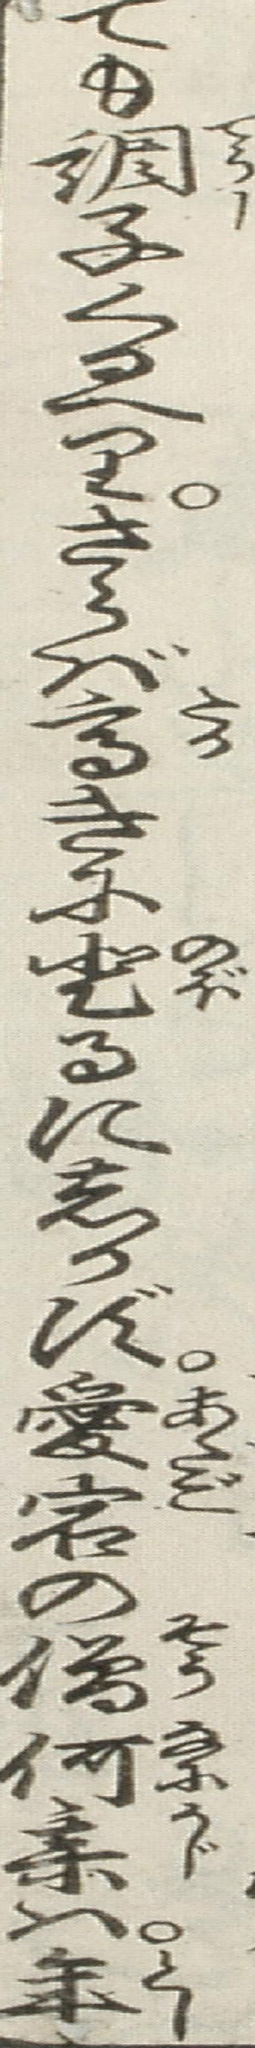ても調子くるへり。さらば高きに登るにしかず。愛宕の僧何某は。年
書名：安政見聞録　下
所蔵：東京大学地震研究所図書室 Earthquake Research Institute Library, The University of Tokyo, JAPAN
